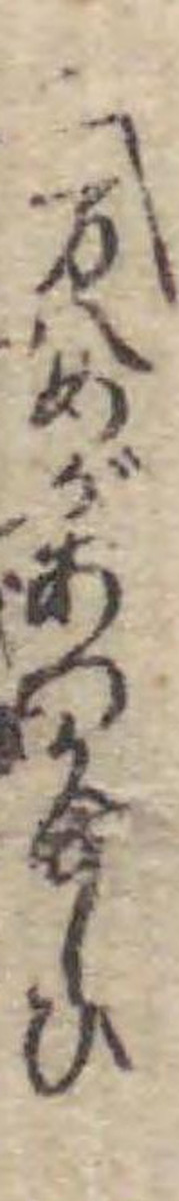〽万八めがあつかましひ
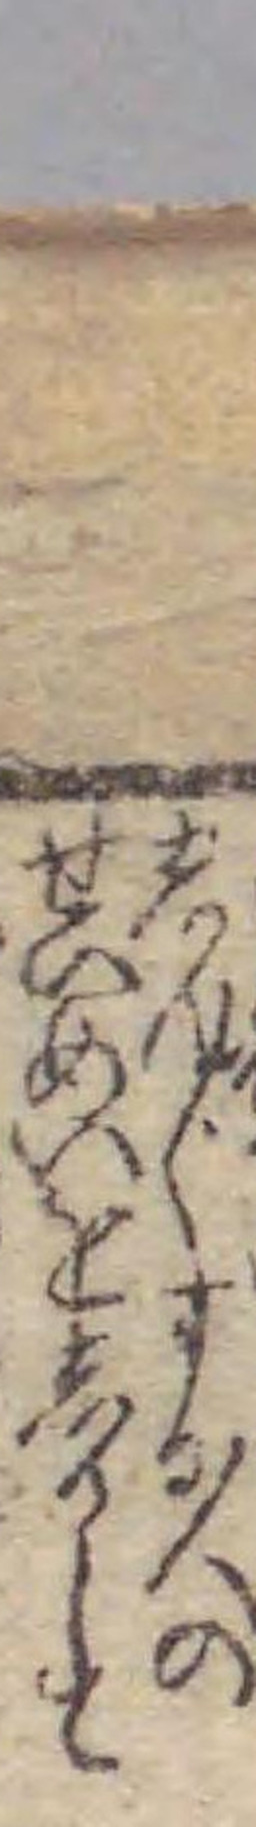せいめいをしるして
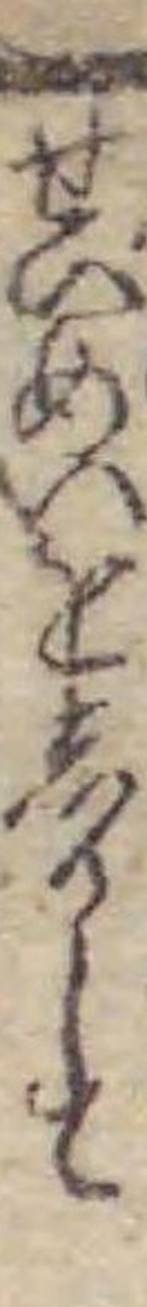せいめいをしるして
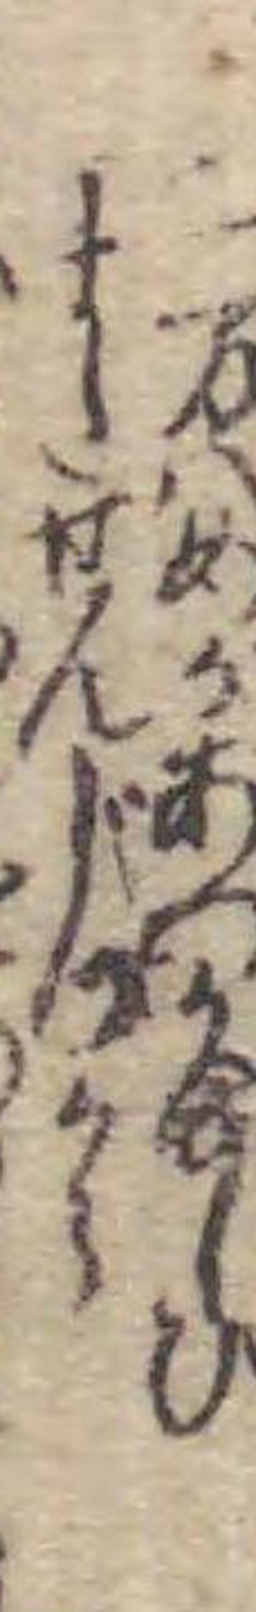またせんじつから
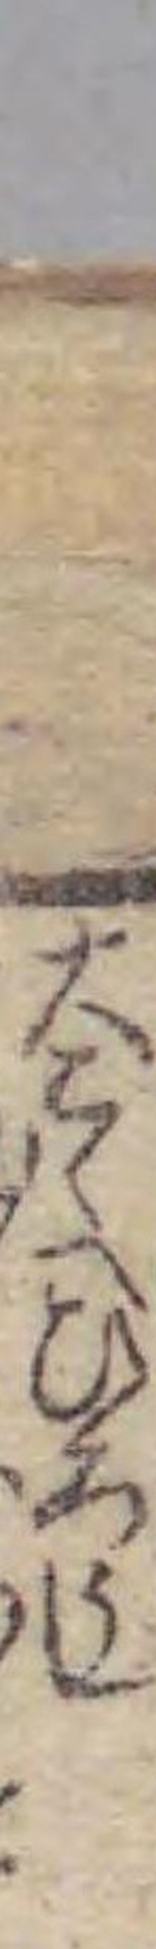大こくへひろうし
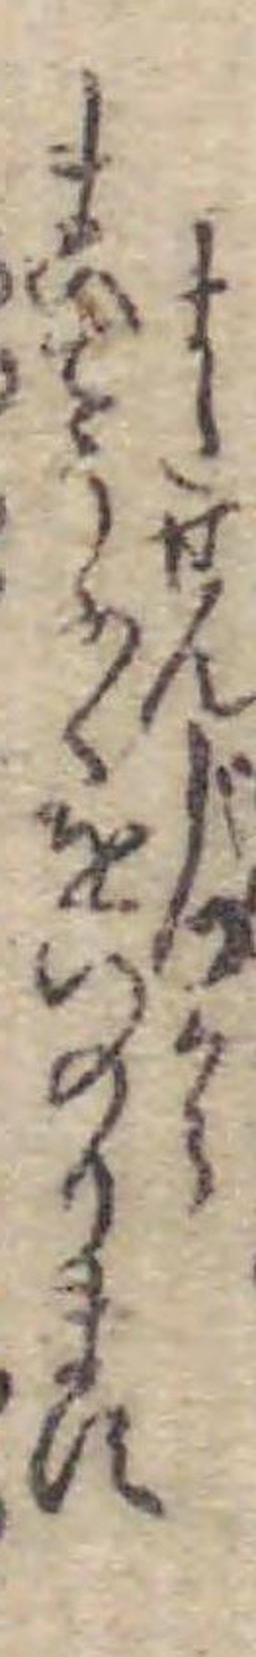まいてうふくをいのります
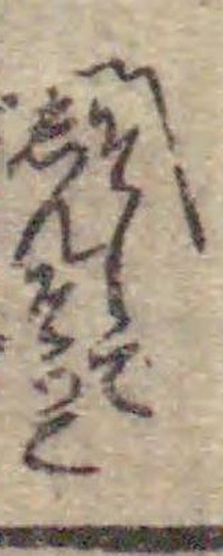しんそつこ
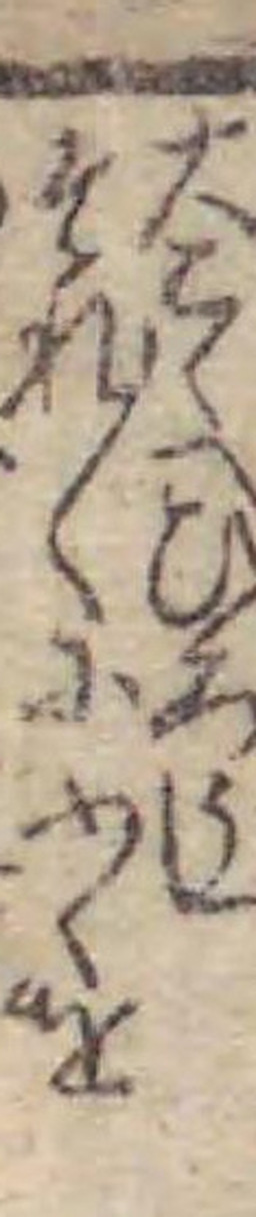それ〳〵にふくを
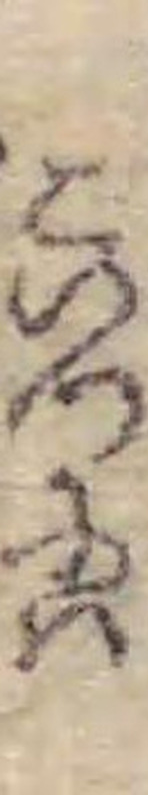こいつには
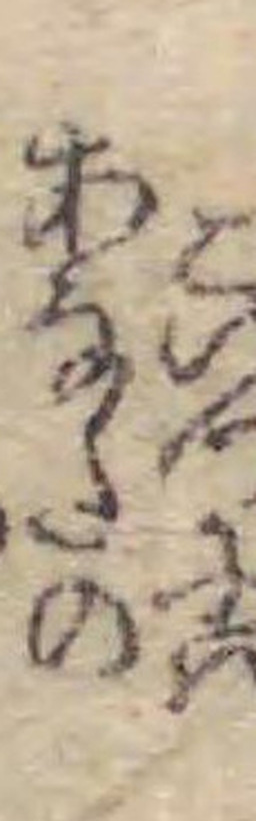あなたの
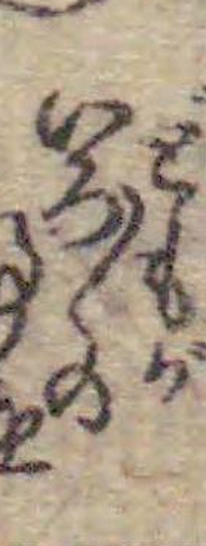いろ〳〵の
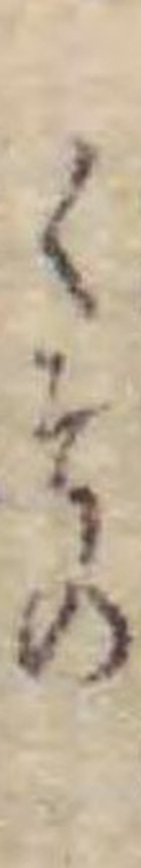くその
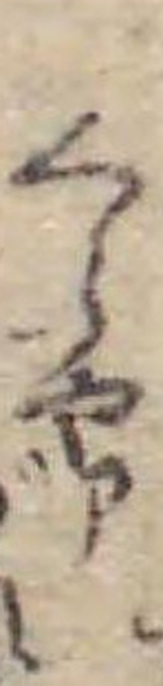くらやァ
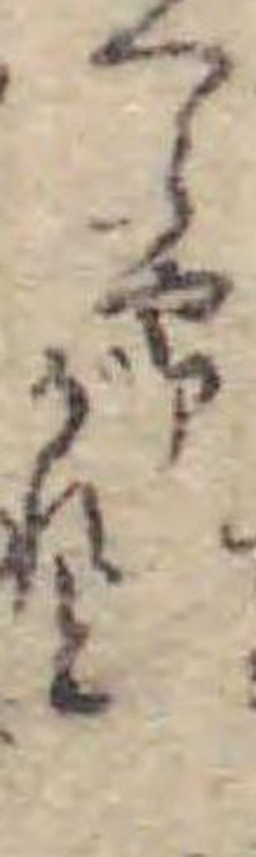がれと
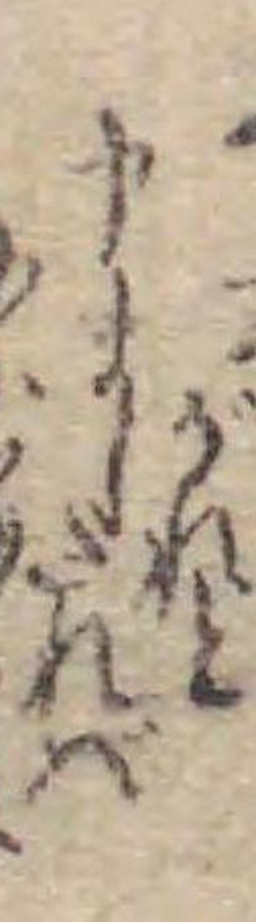申ましたれば
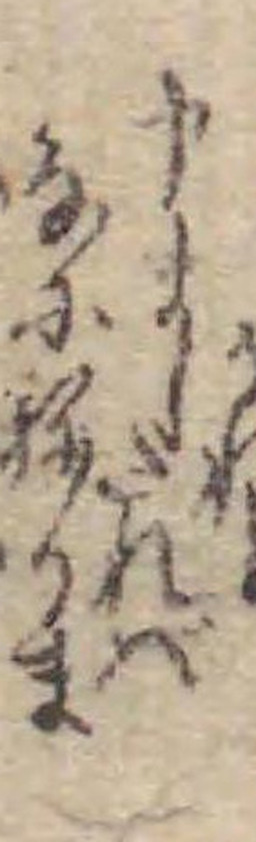なにねりま
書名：新鋳小判 : 3巻
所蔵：国立国会図書館 National Diet Library, JAPAN
